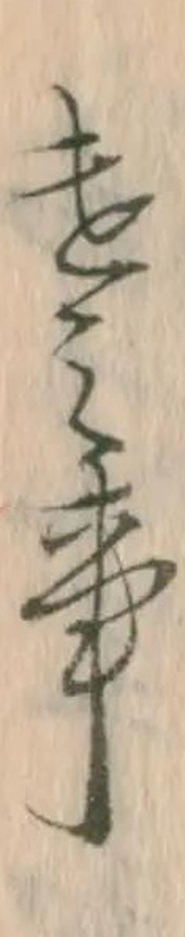遣之事
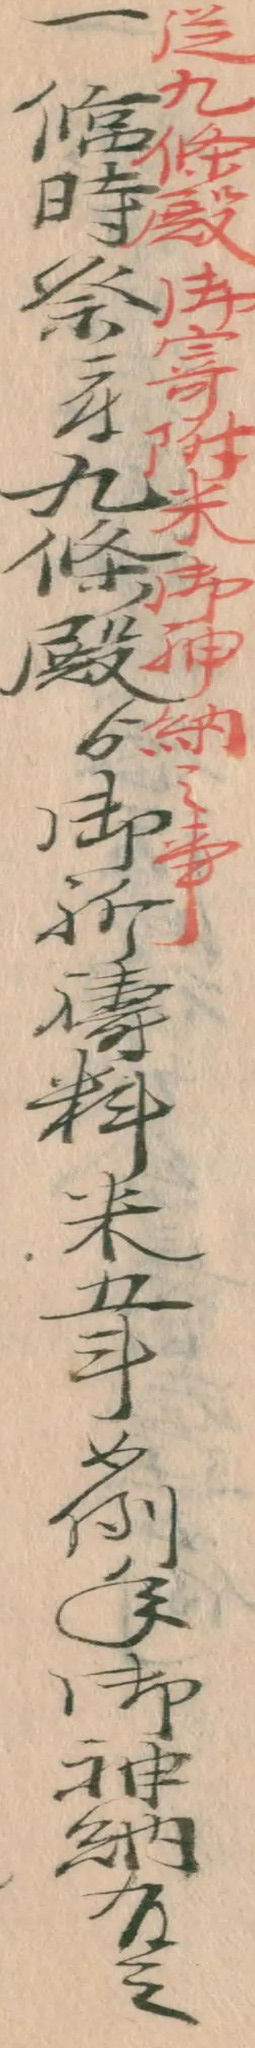一臨時祭ニ付九條殿ゟ御祈祷料米五斗如例年御神納有之
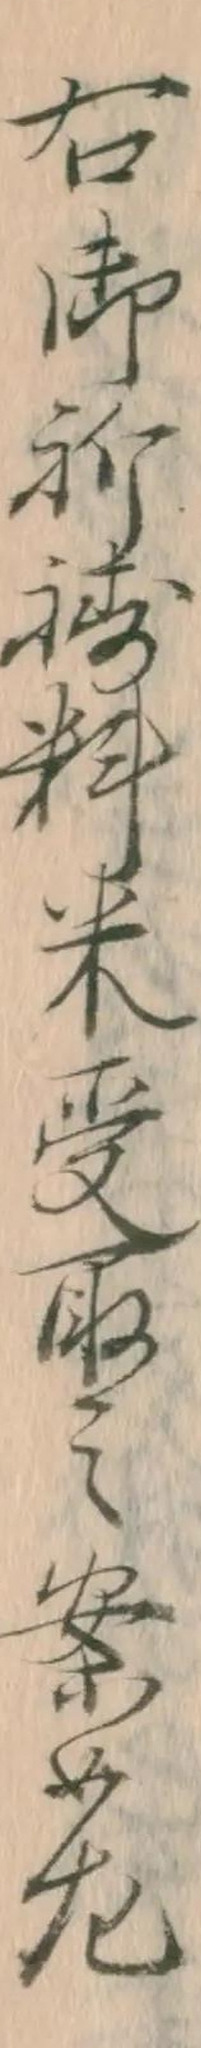右御祈祷料米受取之案如左
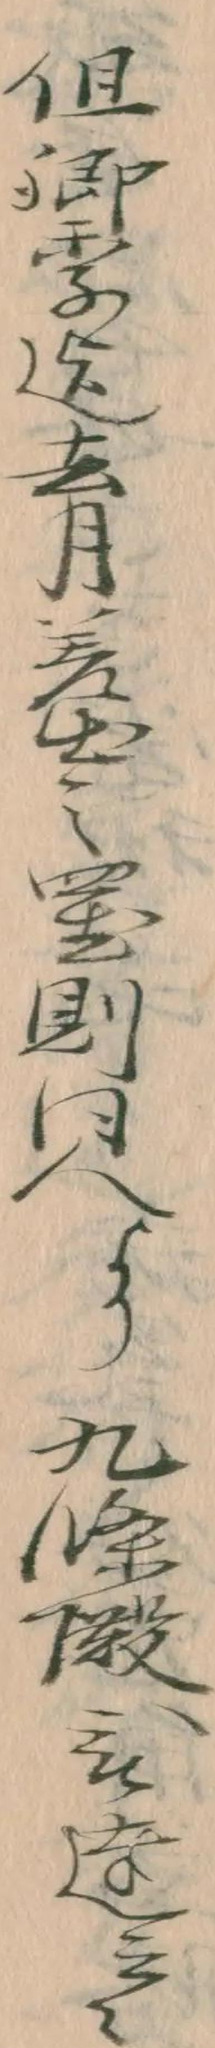但郷季迄去月差出之置則同人より九條殿へ被達云々
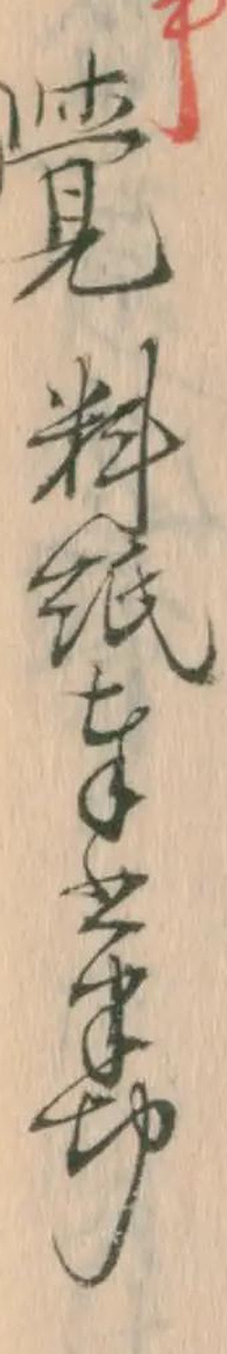覚料紙奉書半切
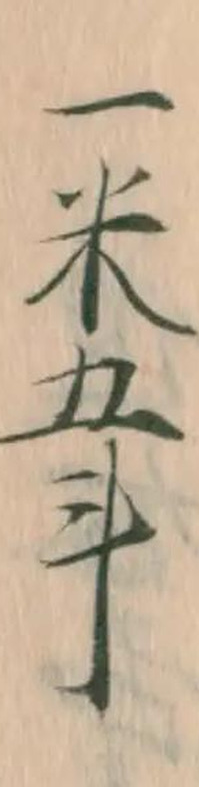一米五斗
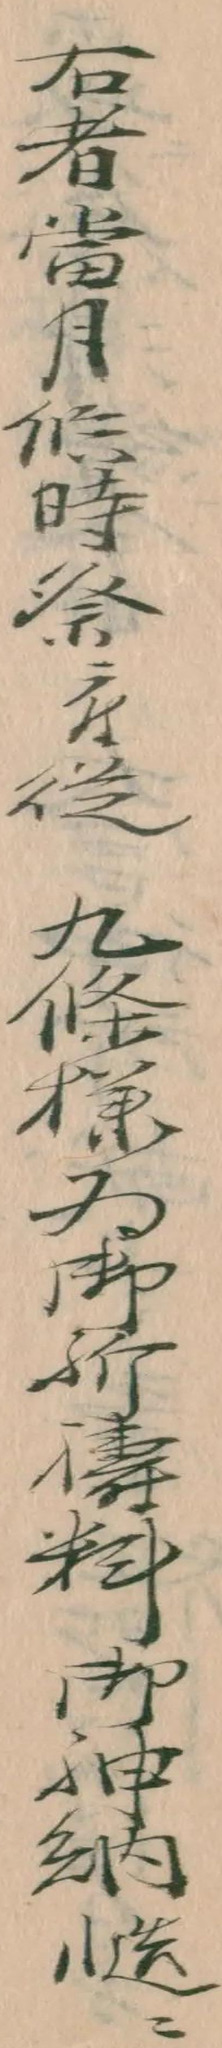右は當月臨時祭ニ付従九條様為御祈祷料御神納慥ニ
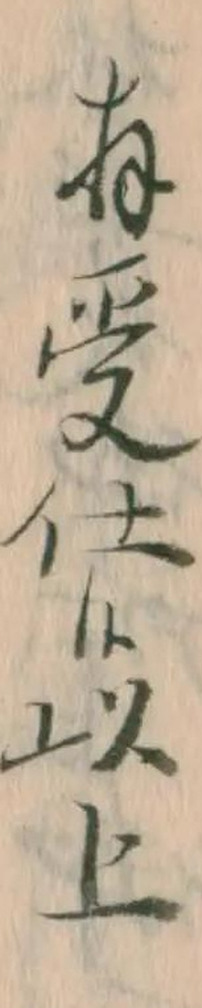拝受仕候以上
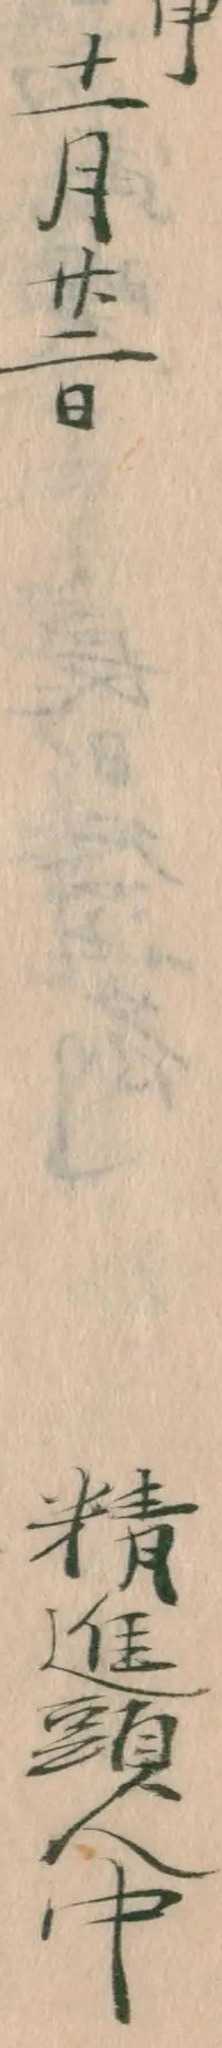申十一月廿二日精進頭人中
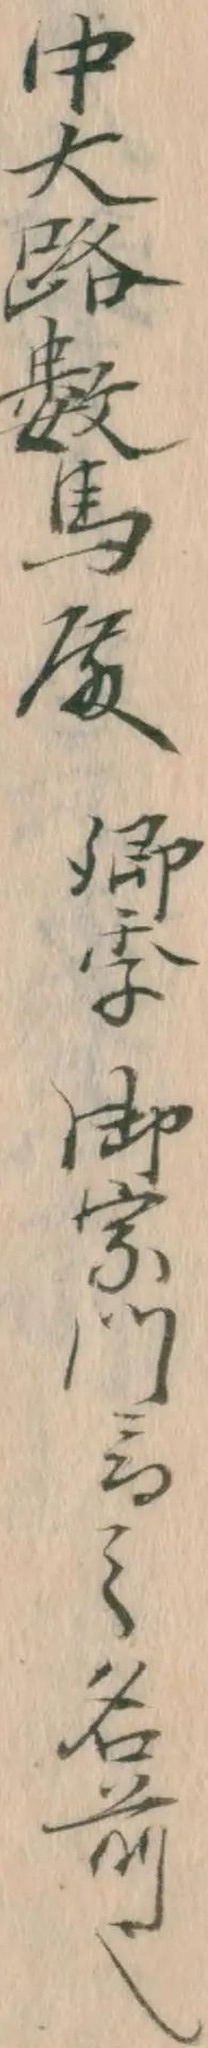中大路数馬殿郷季御家門ニ而之名前也
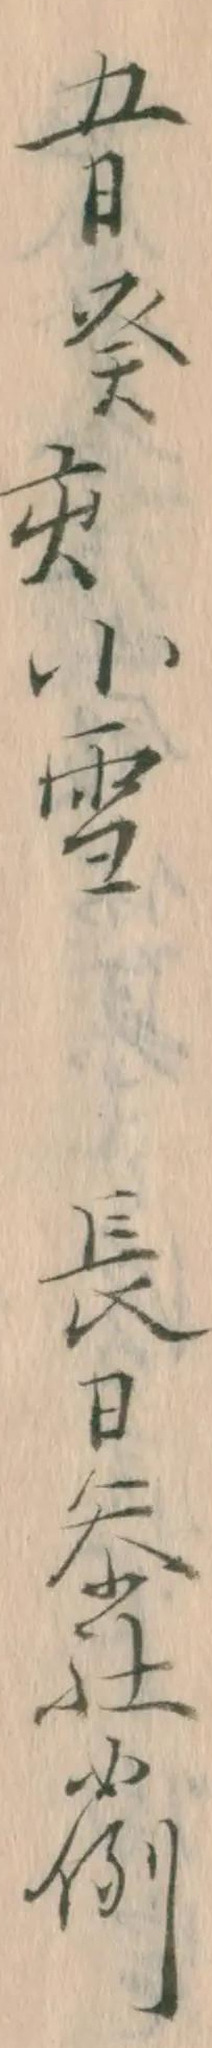五日癸亥小雪長日参社如例
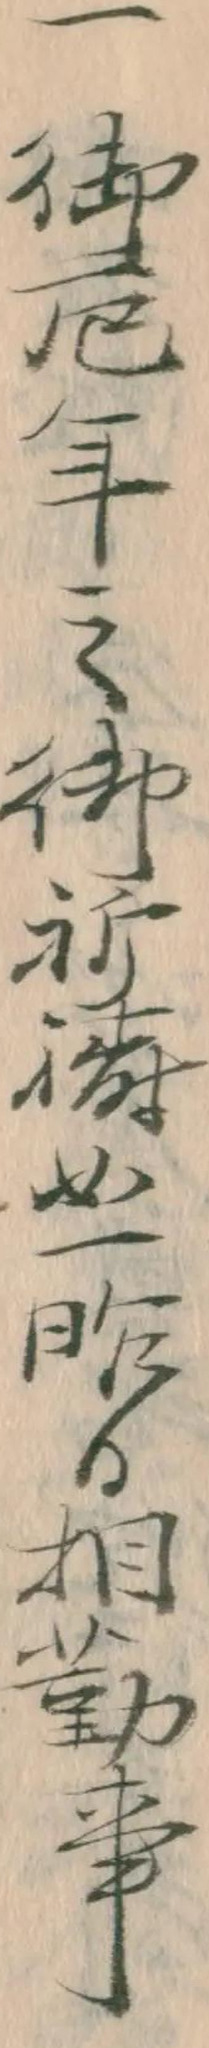一御厄年之御祈祷如一昨日相勤事
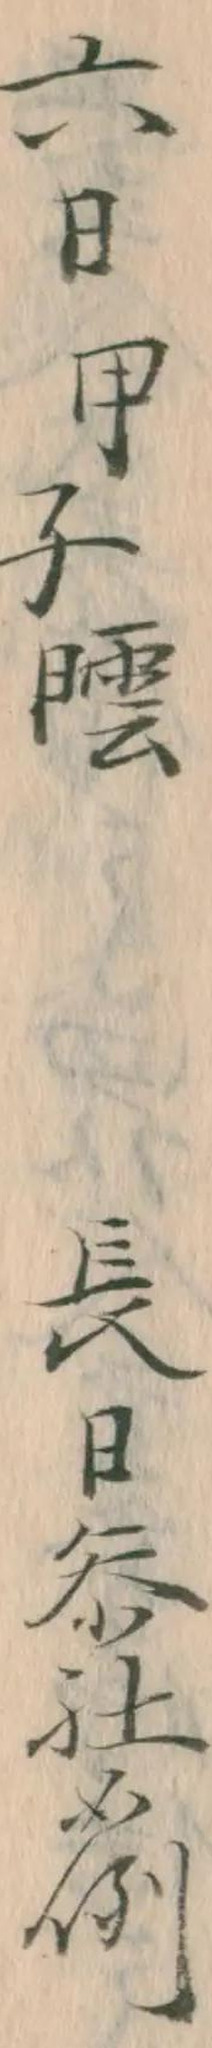六日甲子曇長日参社如例
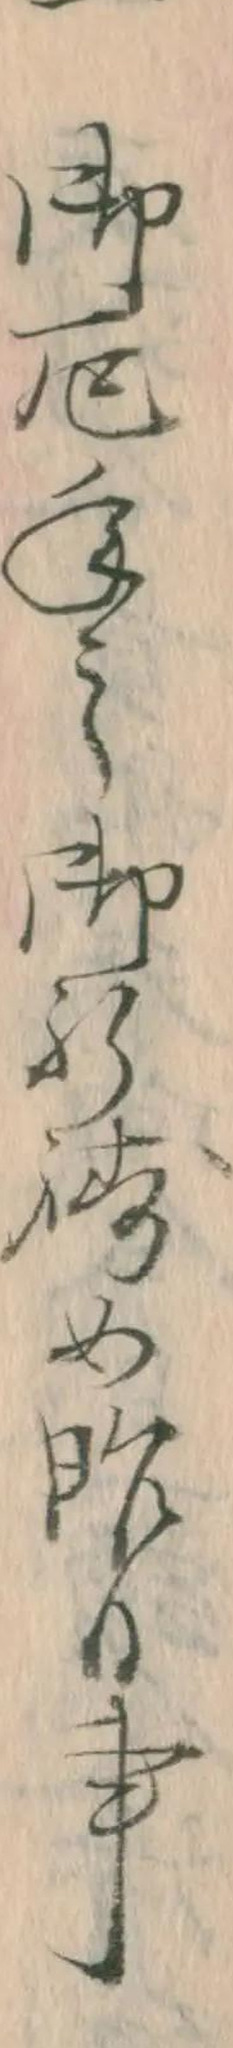一御厄年之御祈祷如昨日事
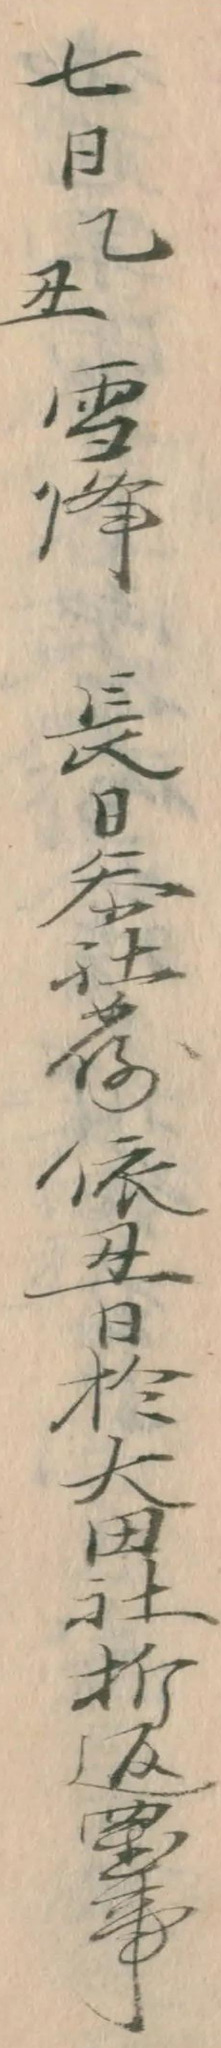七日乙雪降長日谷社如例依丑日於大田壮折返置事

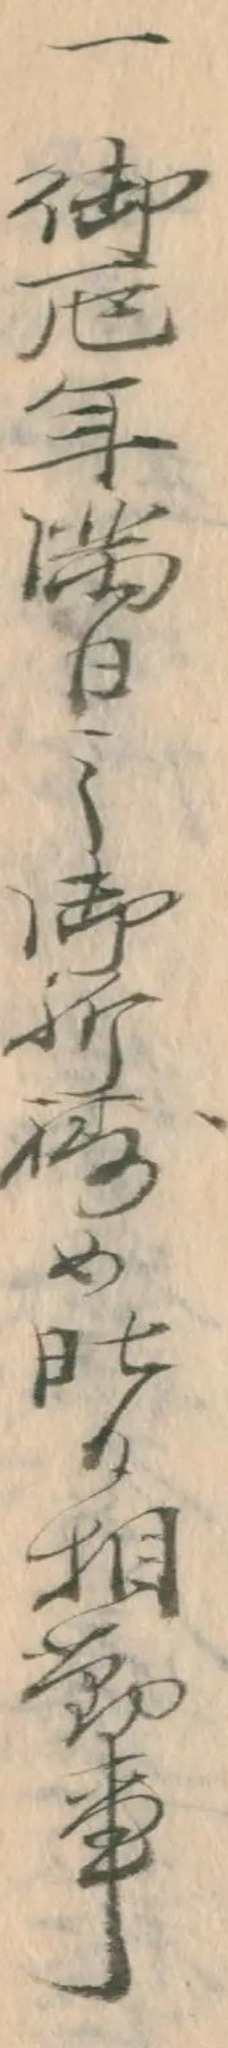一御厄年満日之御祈祷如昨日相勤事
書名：賀茂社記録. 第74冊
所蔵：国立国会図書館 National Diet Library, JAPAN
